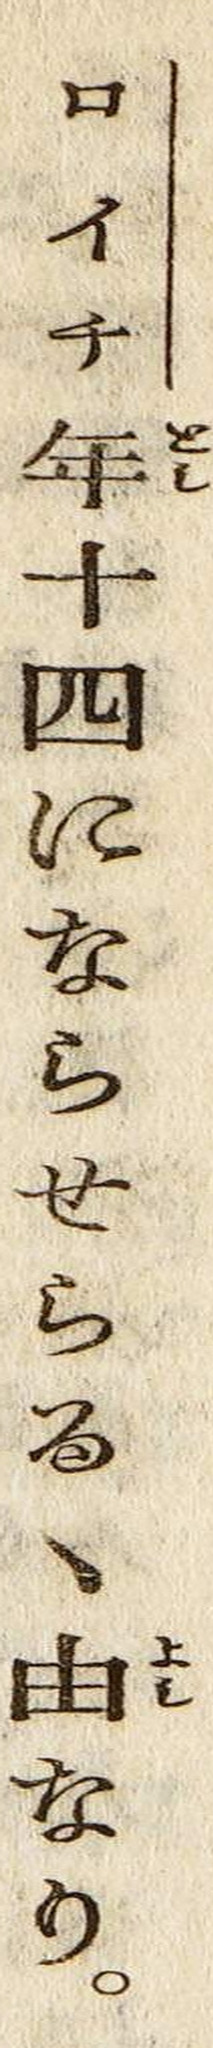ロイチ年十四にならせらるゝ由なり。
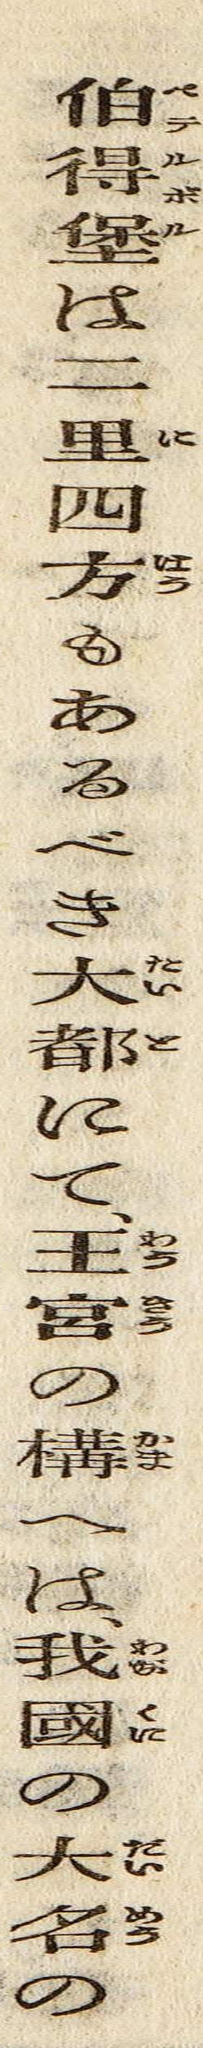伯得堡は二里四方もあるべき大都にて、王宮の構へは、我国の大名の
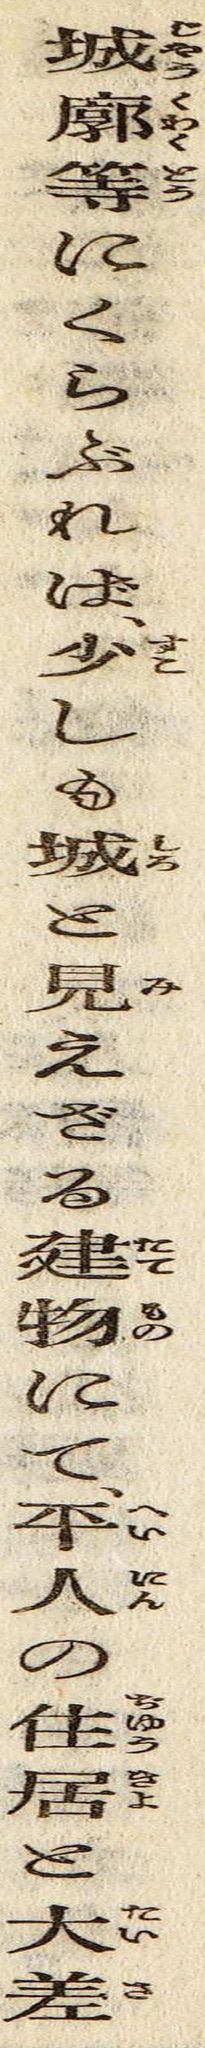城廓等にくらぶれば、少しも城と見えざる建物にて、平人の住居と大差
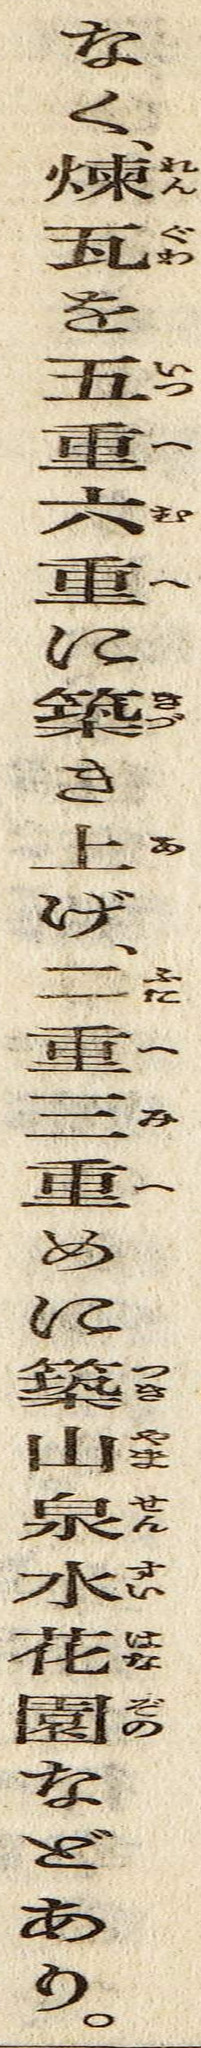なく、煉瓦を五重六重に築き上げ、二重三重めに築山泉水花園などあり。
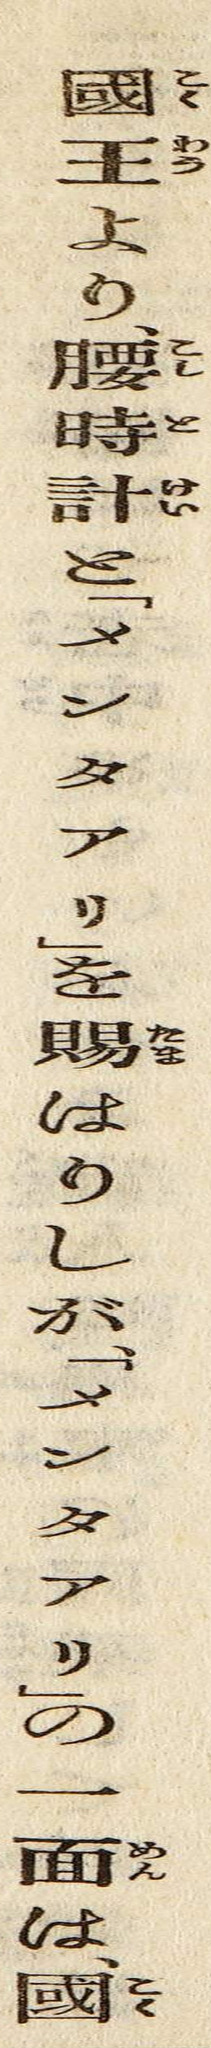国王より、腰時計と「メンタアリ」を賜はりしが、「メンタアリ」の一面は、国
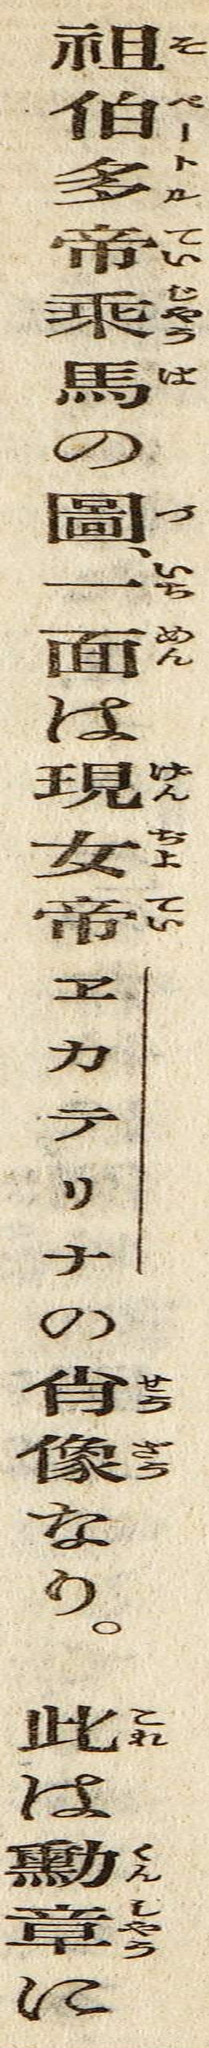祖伯多帝乗馬の図、一面は現女帝エカテリナの肖像なり。此は勲章に
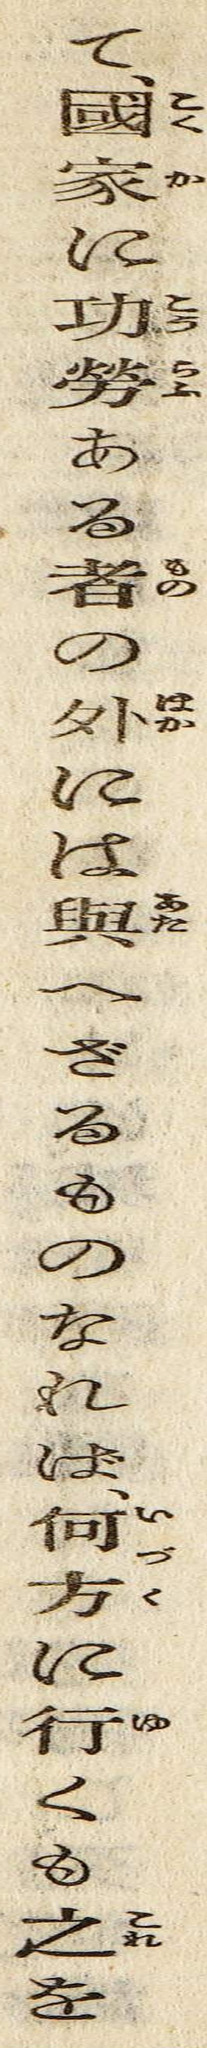て、国家に功労ある者の外には与へざるものなれば、何方に行くも之を
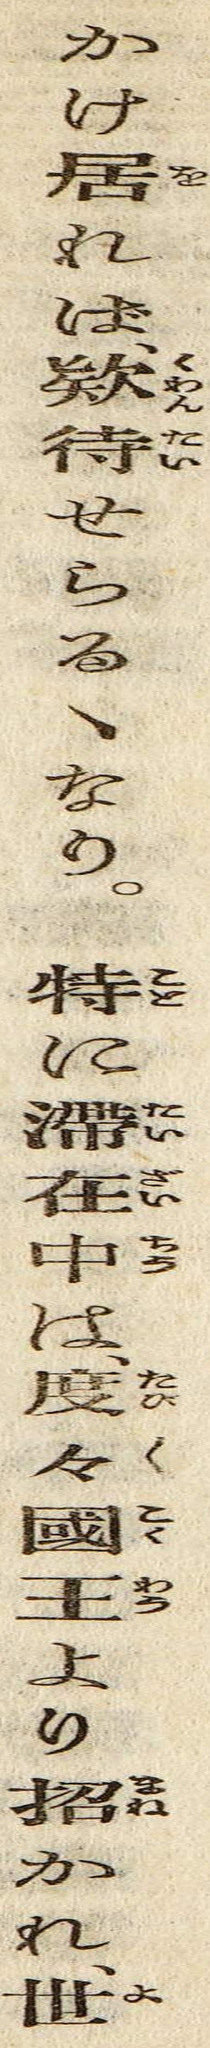かけ居れば、歓待せらるゝなり。特に滞在中は、度々国王より招かれ、世

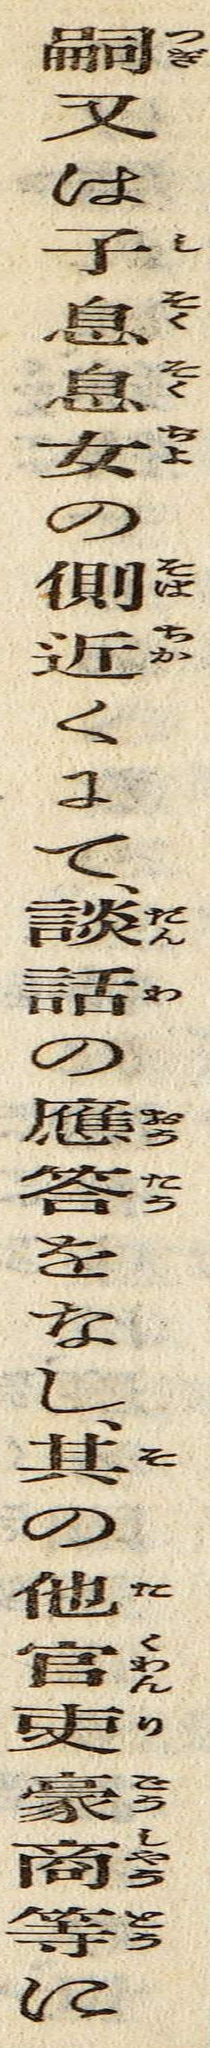継又は子息息女の側近くにて、談話の応答をなし、其の他官吏豪商等に
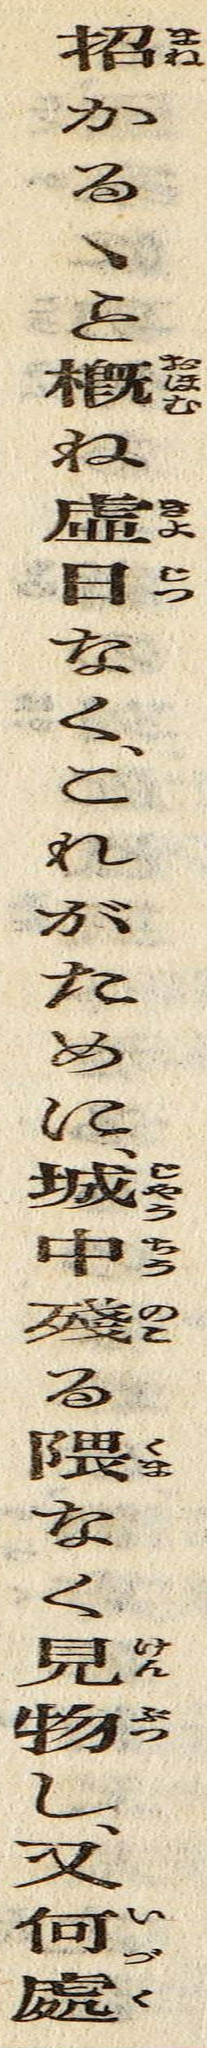招かるゝこと概ね虚日なく、これがために、城中残る隈なく見物し、又何処
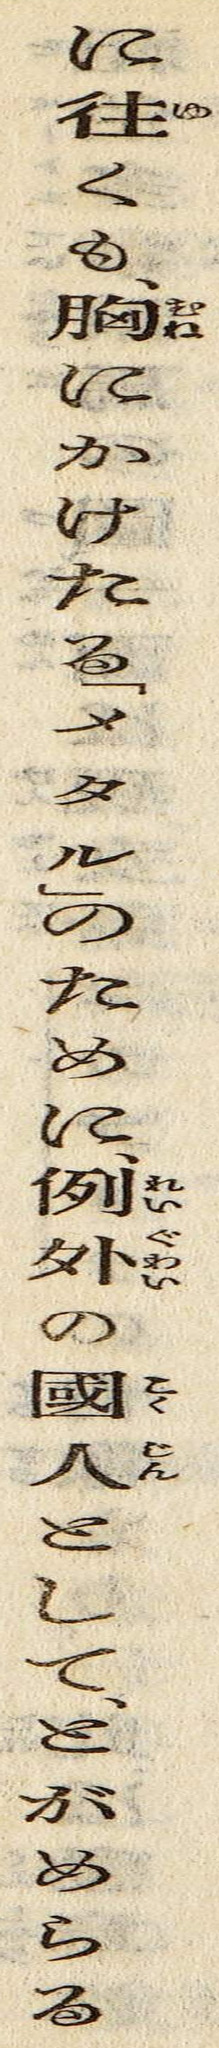に往くも、胸にかけたる「メタル」のために、例外の国人として、とがめらる
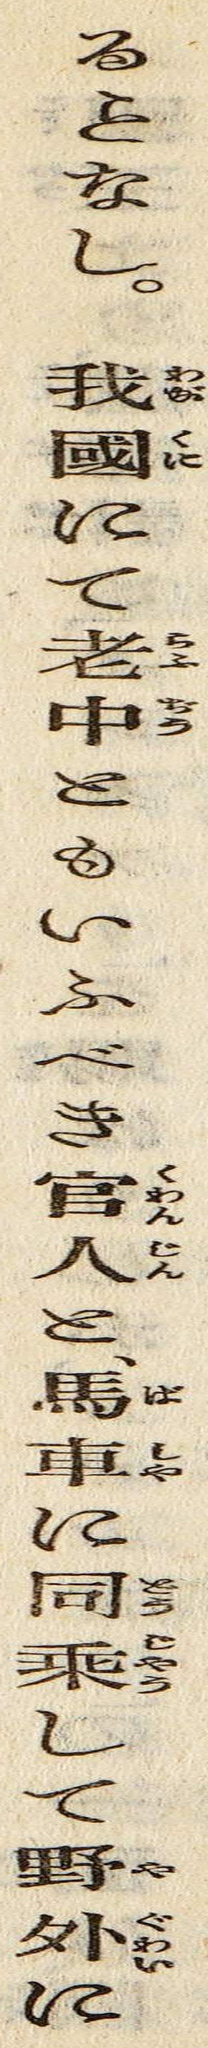ることなし。我国にて老中ともいふべき官人と、馬車に同乗して野外に
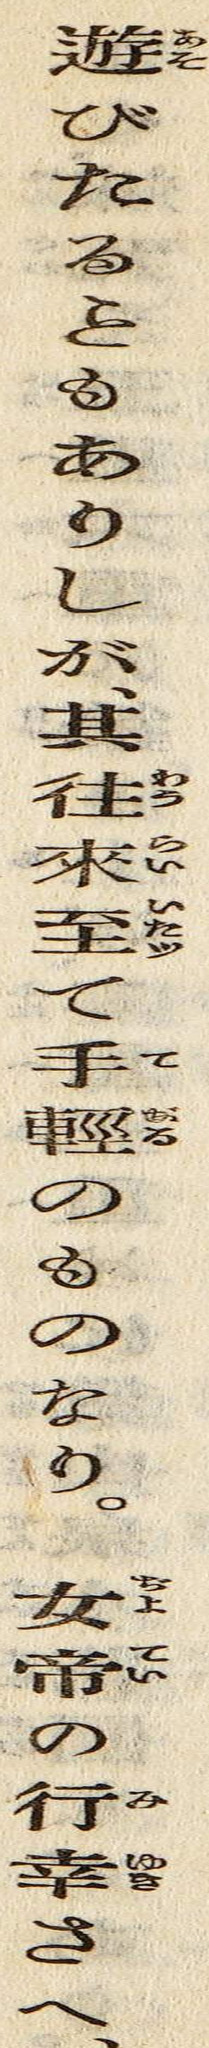遊びたることもありしが、其往来至て手軽のものなり。女帝の行幸さへ、
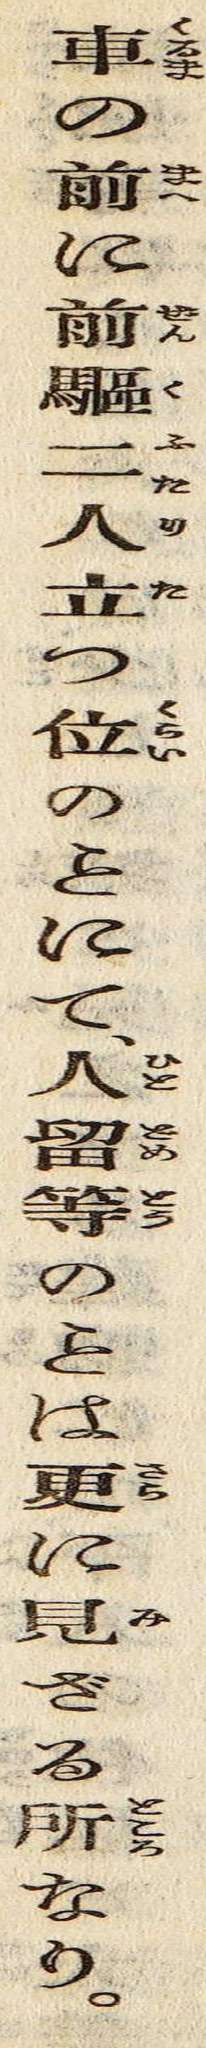車の前に前駆二人立つ位のことにて、人留等のことは更に見ざる所なり
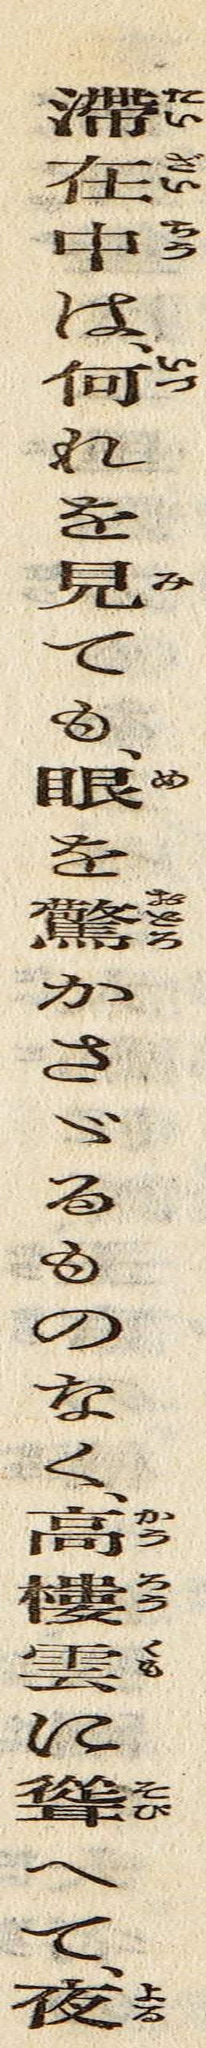滞在中は、何れを見ても、眼を驚かさゞるものなく、高楼雲に聳へて、夜
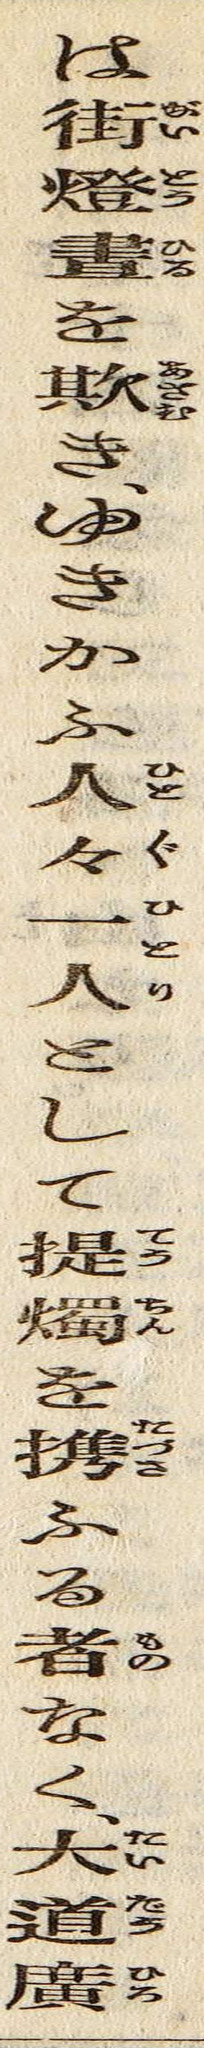は街灯昼を欺き、ゆきかふ人々一人として提灯を携ふる者なく、大道広
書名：日本漂流譚
